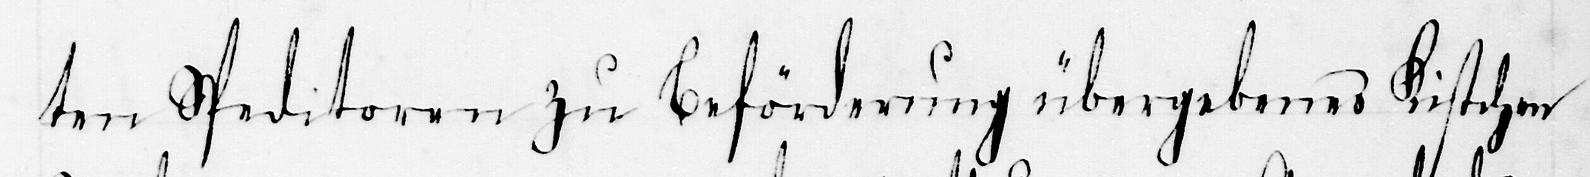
ten Speditoren zu Beförderung übergebenes Kistchen
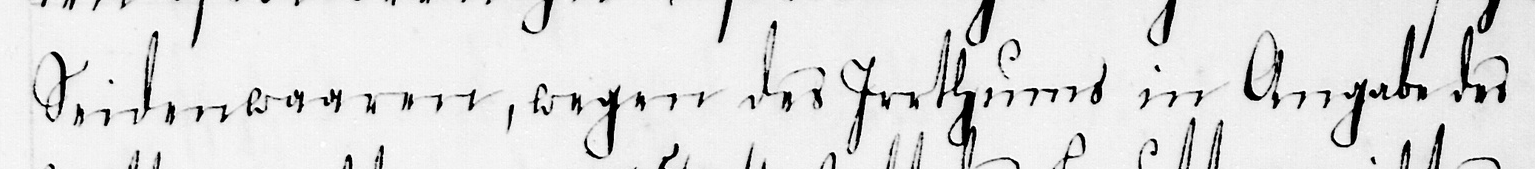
Seidenwaaren, wegen des Irrthums in Angabe des
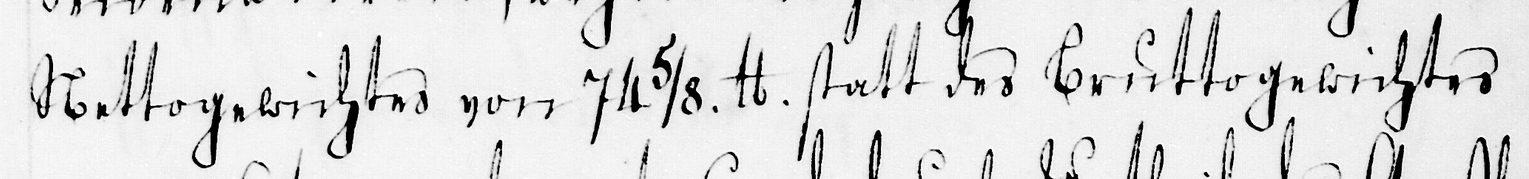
Nettogewichtes von 74 5/8. lb. statt des Bruttogewichtes
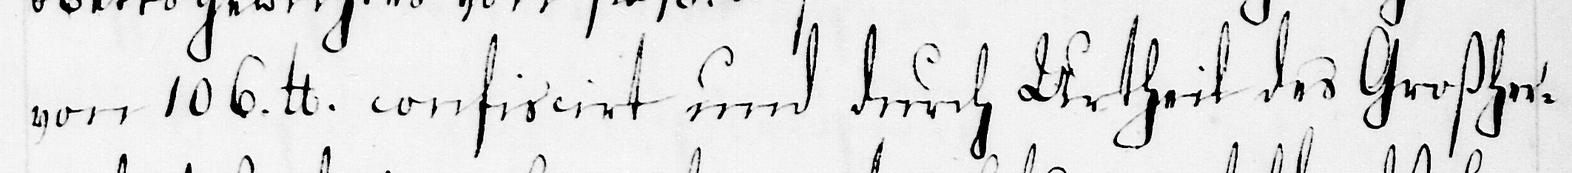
von 106. lb. confiscirt und durch Urtheil des Großher¬
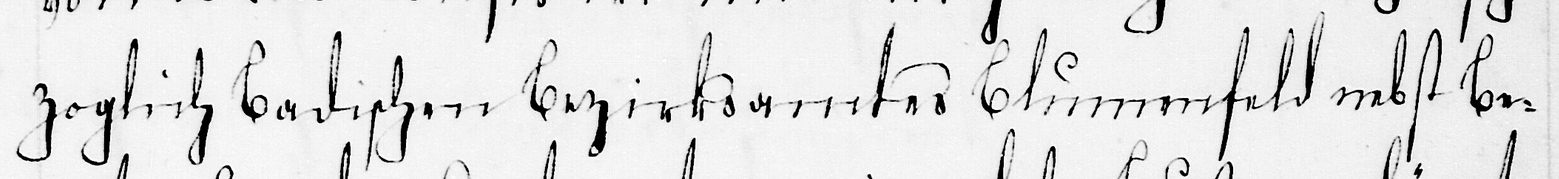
zoglich Badischen Bezirksamtes Blumenfeld nebst Be¬
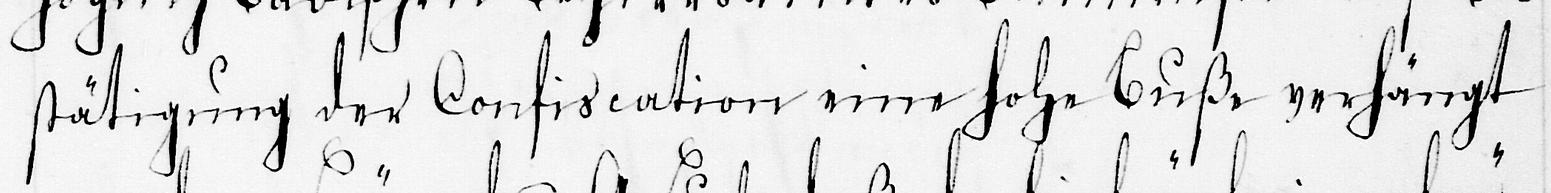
stätigung der Confiscation eine hohe Buße verhängt
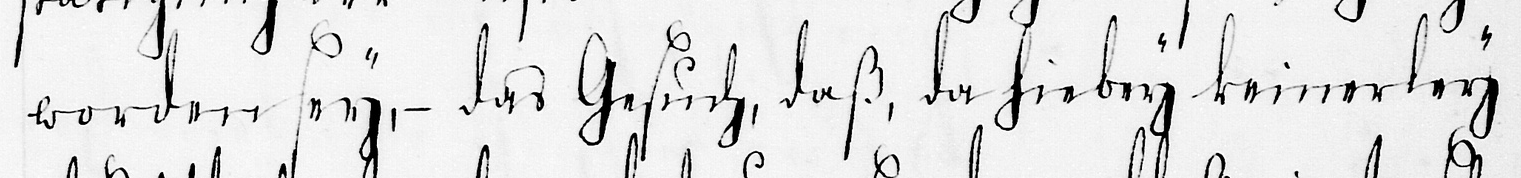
worden sey, – das Gesuch, daß, da hiebey keinerley
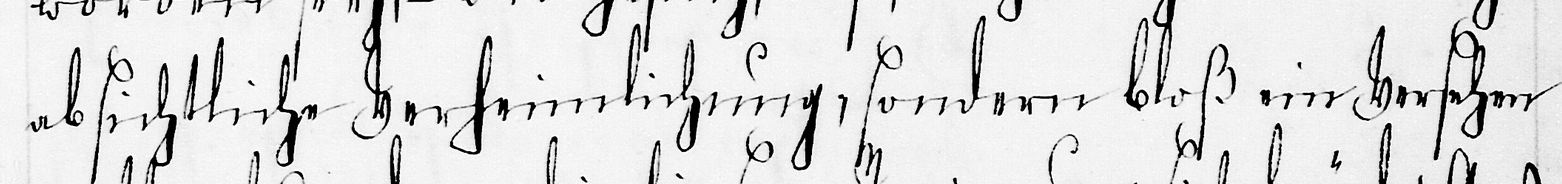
absichtliche Verheimlichung, sondern bloß ein Versehen
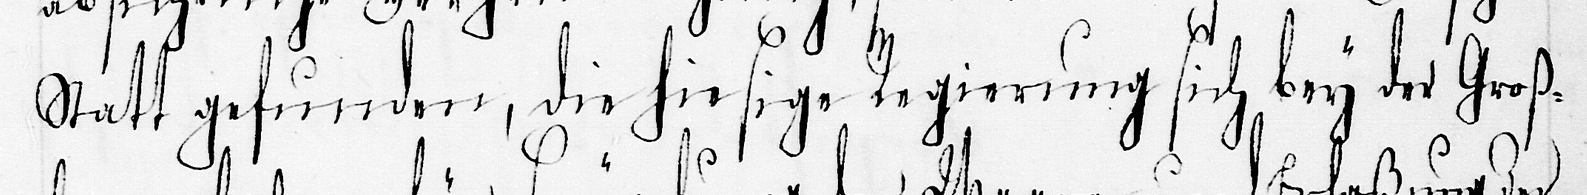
Statt gefunden, die hiesige Regierung sich bey der Groß¬
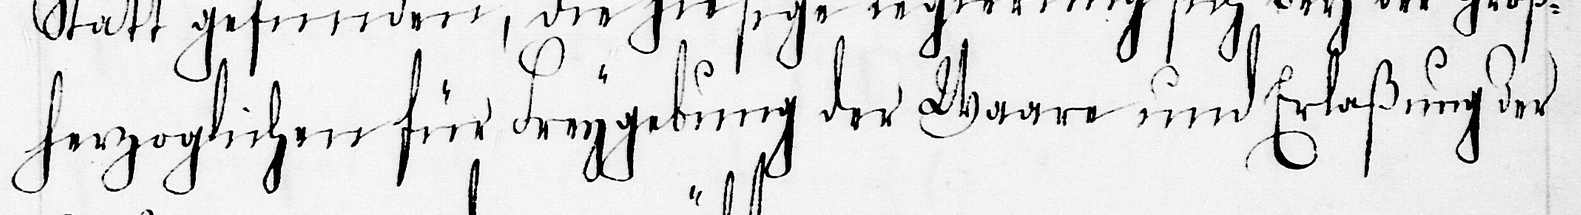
herzoglichen für Freygebung der Waare und Erlaßung der
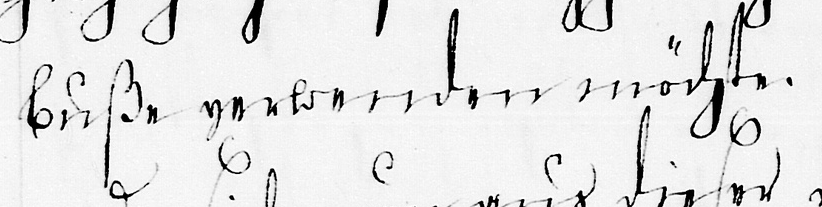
Buße verwenden möchte.
